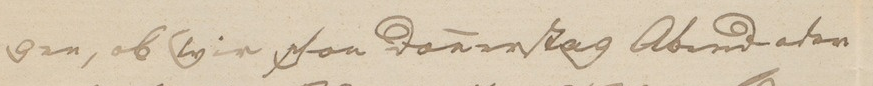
gen, ob wir schon Donnerstag Abend oder
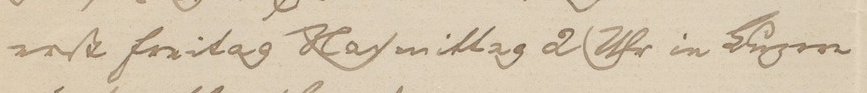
erst Freitag Nachmittag 2 Uhr in Luzern
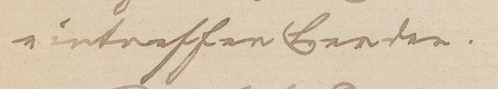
eintreffen werden.
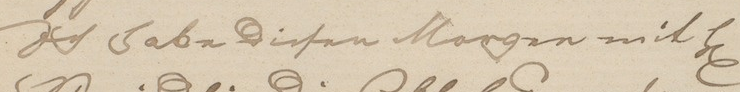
Ich habe diesen Morgen mit H
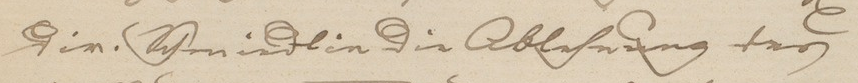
Dir. Schmiedlin die Ablehnung des
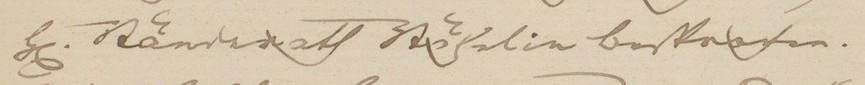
H. Ständerath Stählin besprochen.
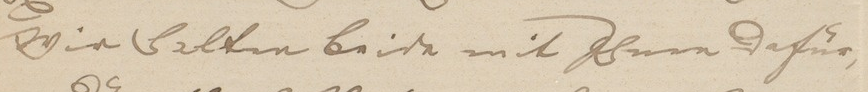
Wir halten beide mit Ihnen dafür,
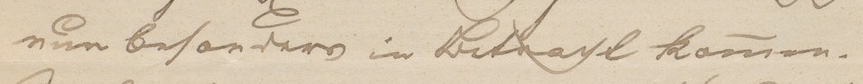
nun besonders in Betracht kommen.
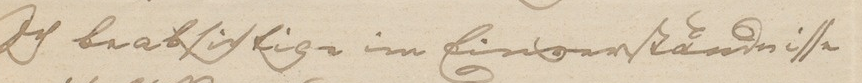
Ich beabsichtige im Einverständnisse
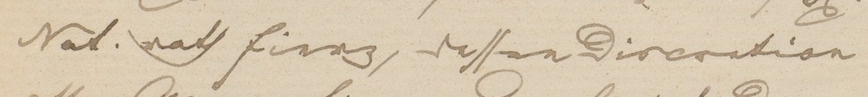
Nat.rath Fierz, dessen Discretion
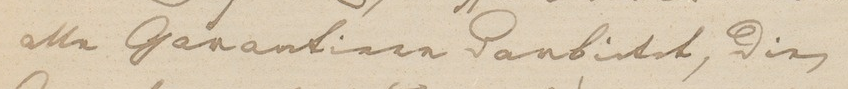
alle Garantieen darbietet, die
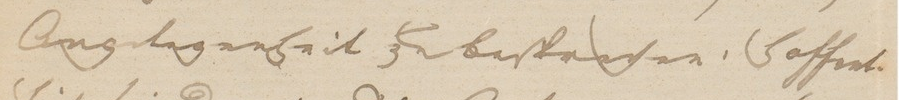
Angelegenheit zu besprechen. Hoffent-
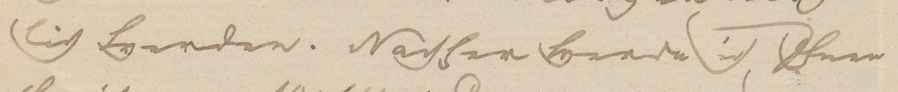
lich werden. Nachher werde ich Ihnen
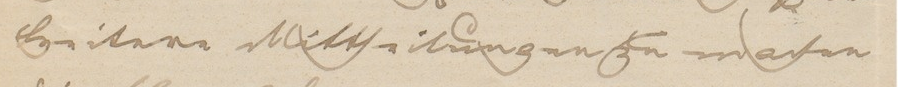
weitere Mittheilungen zu machen
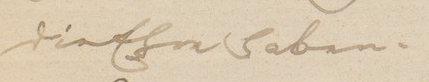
die Ehre haben.
